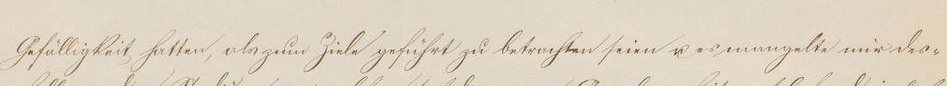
Gefälligkeit hatten, als zum Ziele geführt zu betrachten seien & es mangelte mir des-
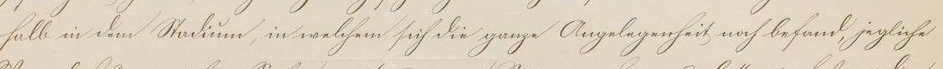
halb in dem Stadium, in welchem sich die ganze Angelegenheit noch befand, jegliche
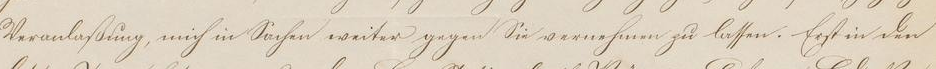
Veranlaßung, mich in Sachen weiter gegen Sie vernehmen zu lassen. Erst in den
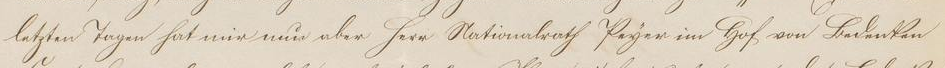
letzten Tagen hat mir nun aber Herr Nationalrath Peyer im Hof von Bedenken
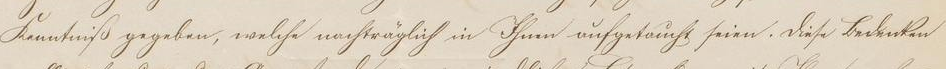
Kenntniß gegeben, welche nachträglich in Ihnen aufgetaucht seien. Diese Bedenken
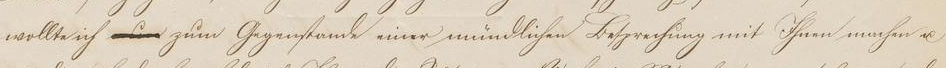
wollte ich nun zum Gegenstande einer mündlichen Besprechung mit Ihnen machen &
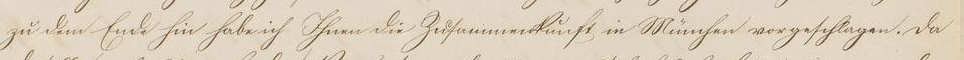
zu dem Ende hin habe ich Ihnen die Zusammenkunft in München vorgeschlagen. Da
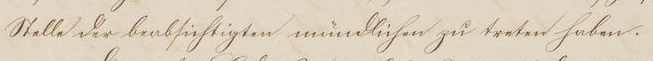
Stelle der beabsichtigten mündlichen zu treten haben.
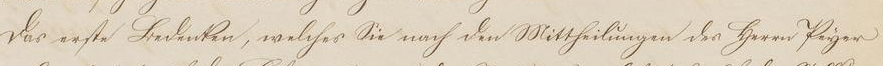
Das erste Bedenken, welches Sie nach den Mittheilungen des Herrn Peyer
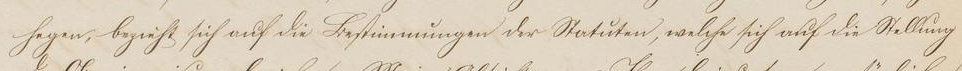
hegen, bezieht sich auf die Bestimmungen der Statuten, welche sich auf die Stellung
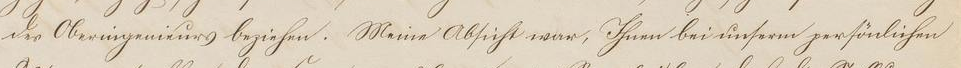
des Oberingenieurs beziehen. Meine Absicht war, Ihnen bei unserm persönlichen
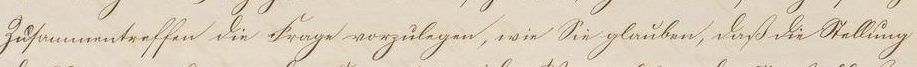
Zusammentreffen die Frage vorzulegen, wie Sie glauben, daß die Stellung
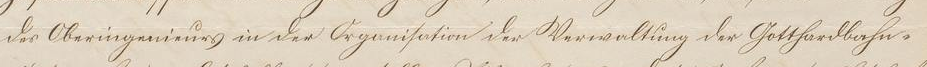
des Oberingenieurs in der Organisation der Verwaltung der Gotthardbahn-
